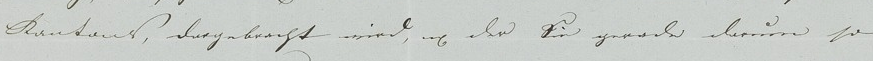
Kantons, dargebracht wird, & der Sie gerade darum so
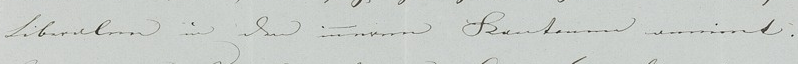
Liberalen in den inneren Kantonen annimt.
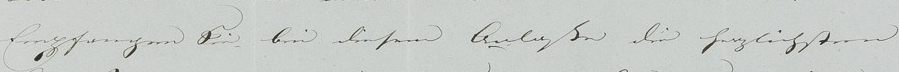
Empfangen Sie bei diesem Anlaße die herzlichsten
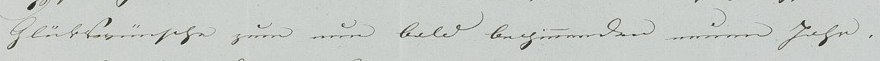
Glükswünsche zum nun bald beginnenden neuen Jahr.
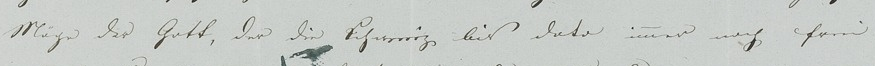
Möge der Gott, der die Schweiz bis dato immer noch frei
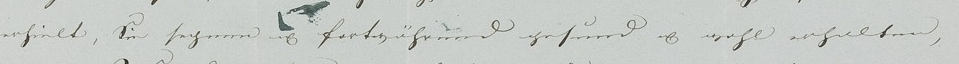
erhielt, Sie segnen & fortwährend gesund & wohl erhalten,
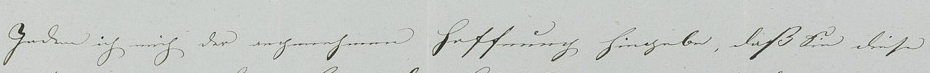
Indem ich mich der angenehmen Hoffnung hingebe, daß Sie diese
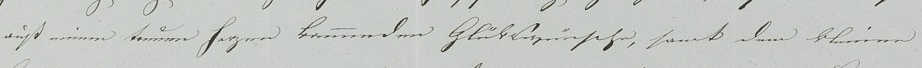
auß einem treuen Herzen kommenden Glückswünsche, samt dem kleinen
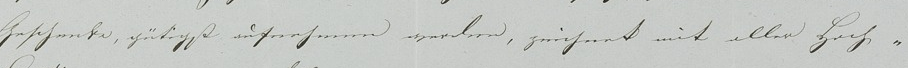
Geschenke, gütigst aufnehmen werden, zeichnet mit aller Hoch-
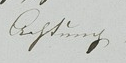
Achtung,
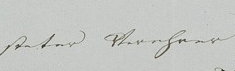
steter Verehrer
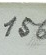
1851.
